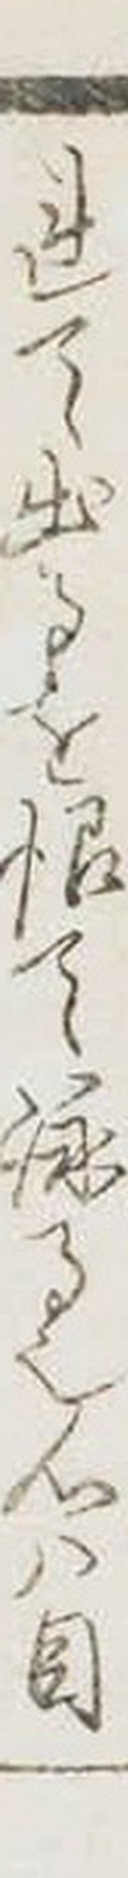れて出るを恨て詠る也心は目
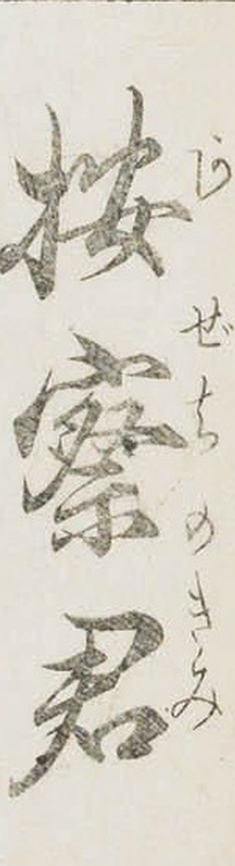按察君
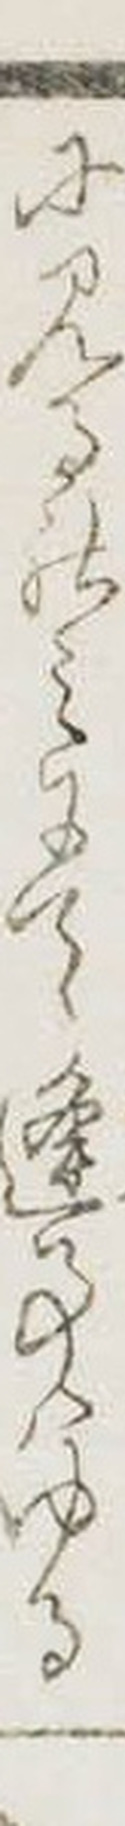に見るのみにて逢事はゆる
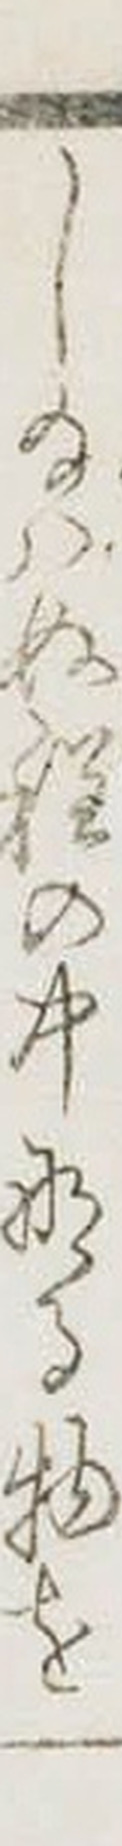し給はぬ程の中なる物を
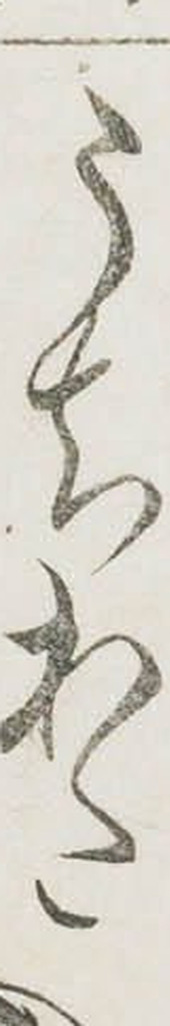うちわた
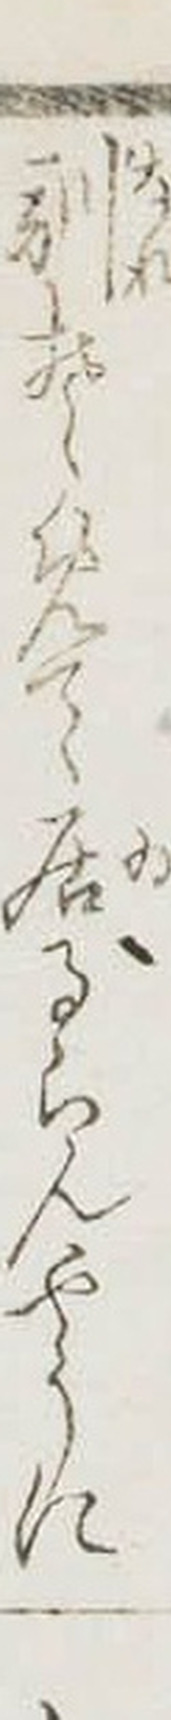馴そめて居るらんやうに
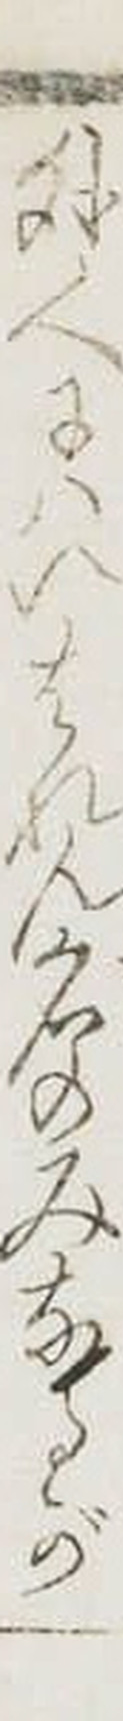外人にはいはれん名のみなるが
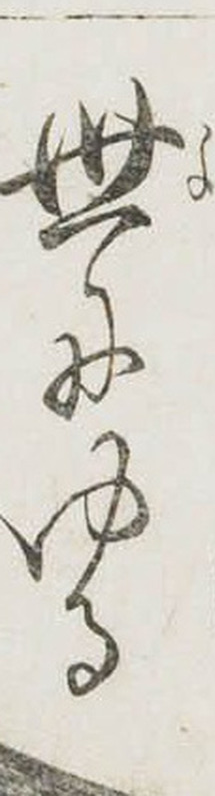世にゆる
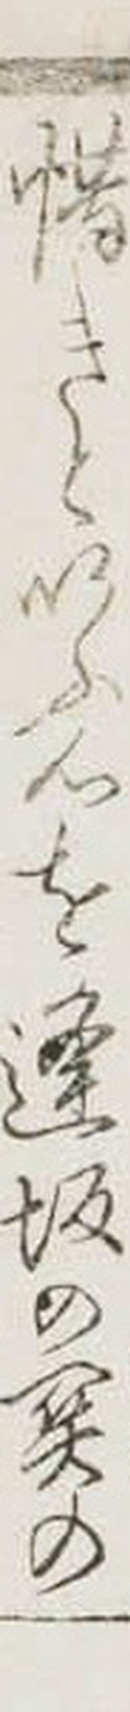惜きといふ心を逢坂の関の
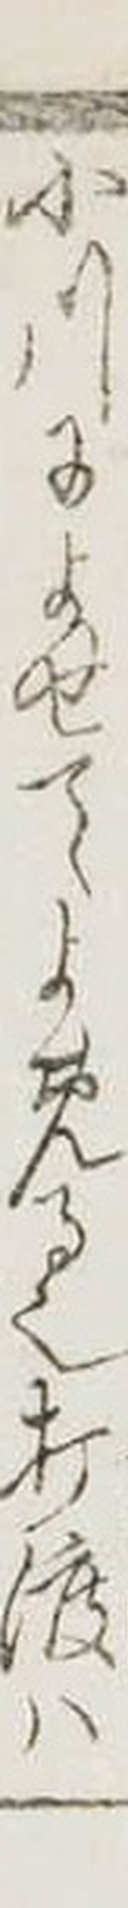小川によせてよめる也打渡は
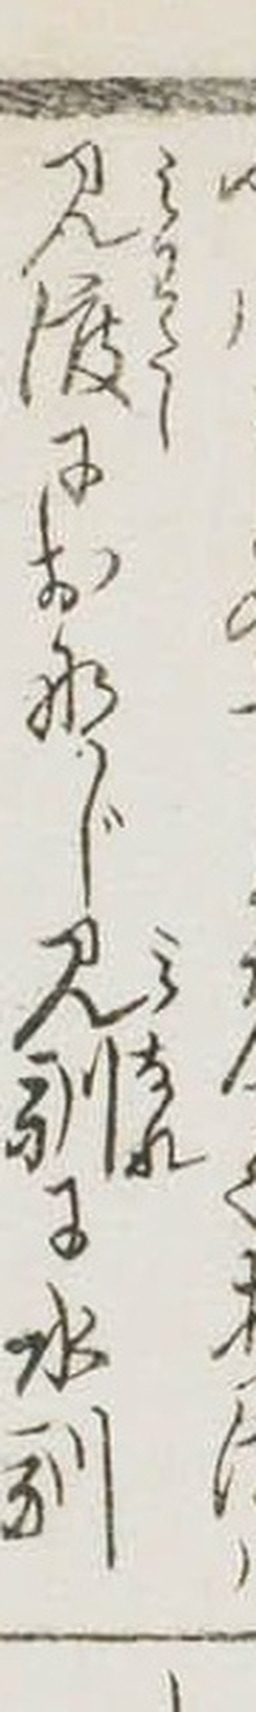見渡におなじ見馴に水馴
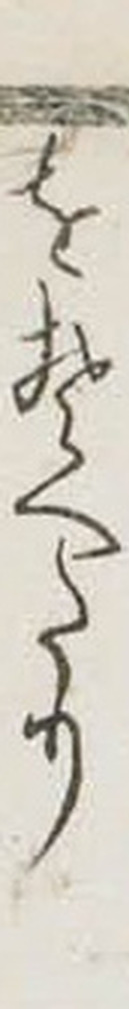をそへたり
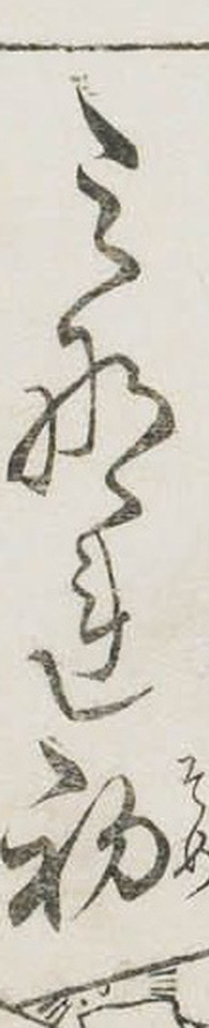みなれ初
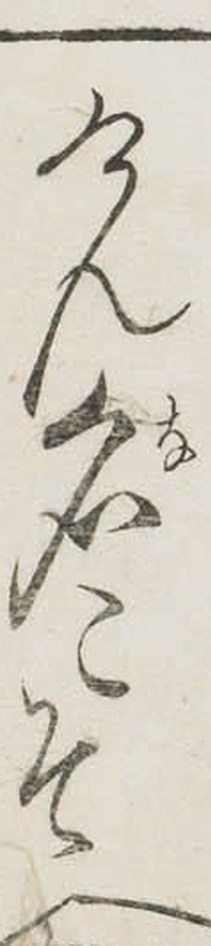けん名こそ
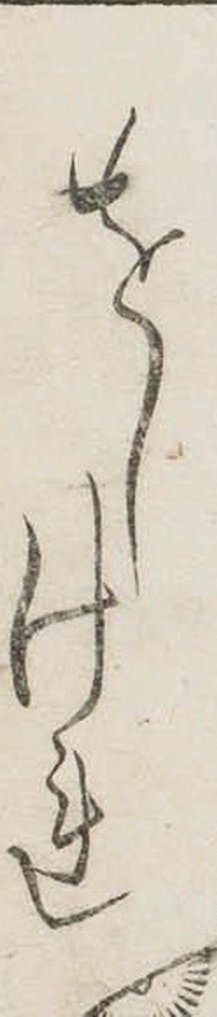をしけれ

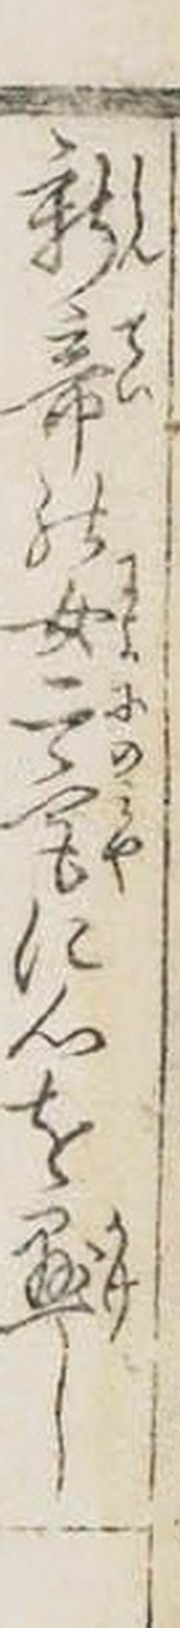新帝の女二宮に心を懸し
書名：源氏百人一首
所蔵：東京学芸大学教育コンテンツアーカイブ
